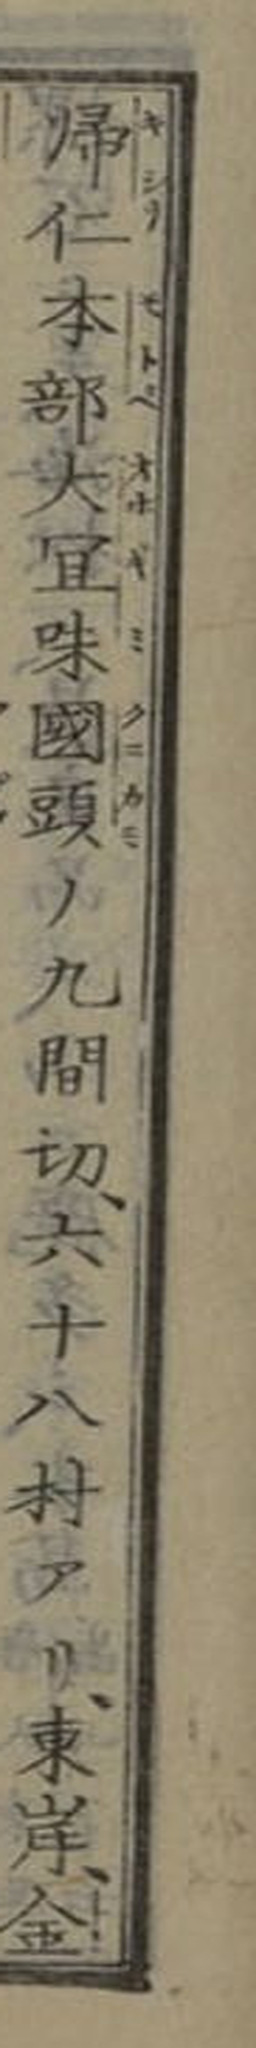帰仁本部大宜味国頭ノ九間切、六十八村アリ、東岸、金
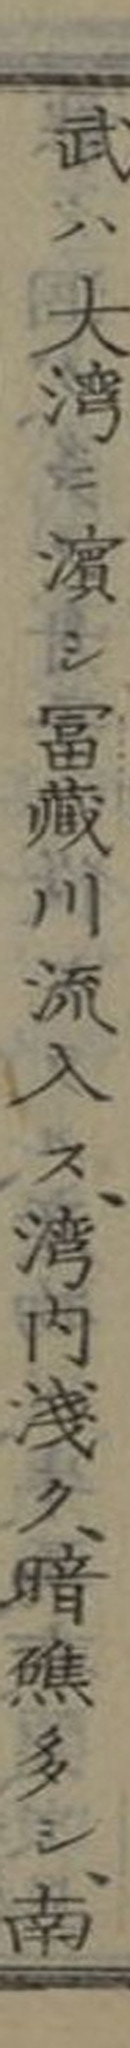武ハ大湾ニ浜シ、富蔵川流入ス、湾内浅ク、暗礁多シ、南
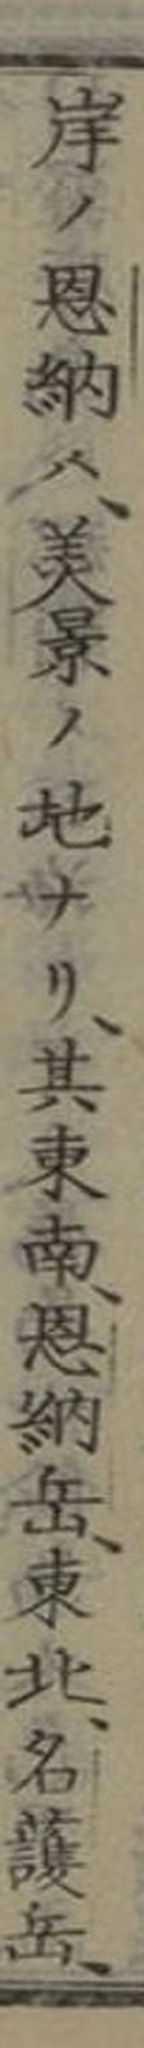岸ノ恩納ハ、美景ノ地ナリ、其東南、恩納岳、東北、名護岳、
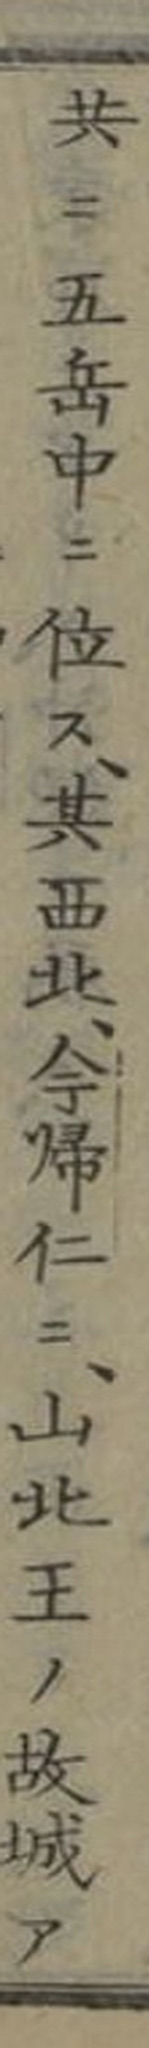共ニ五岳中ニ位ス、其西北、今帰仁ニ、山北王ノ故城ア
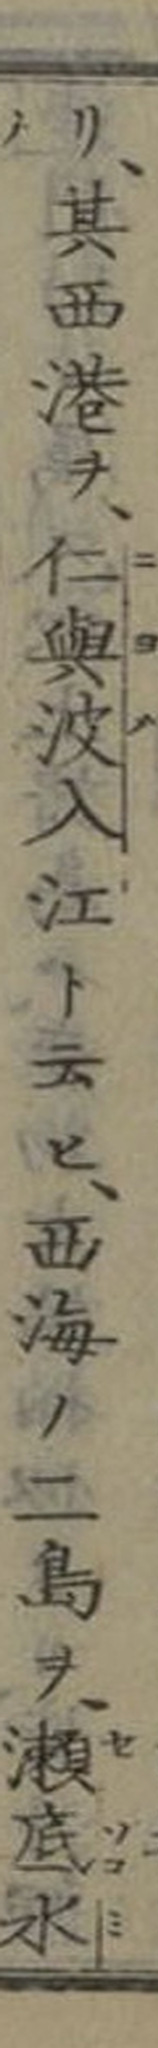リ、其西港ヲ、仁与波入江ト云ヒ、西海ノ二島ヲ、瀬底水
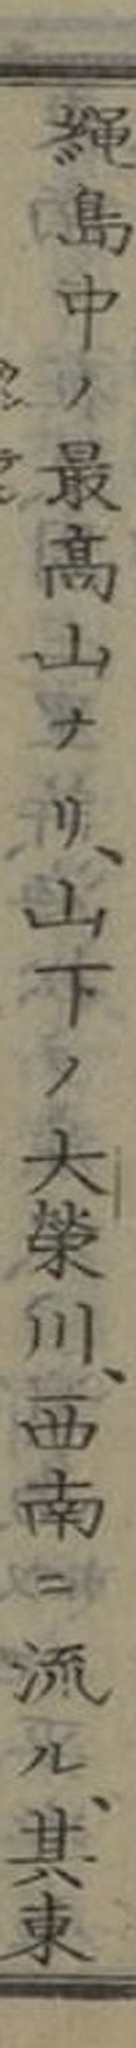縄島中ノ最高山ナリ、山下ノ大栄川、西南ニ流ル、其東
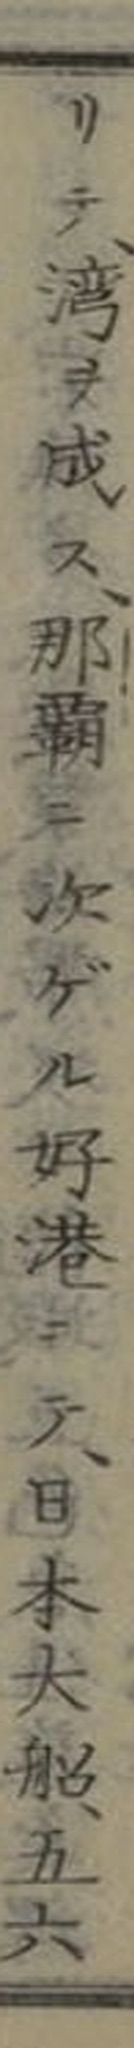リテ、湾ヲ成ス、那覇ニ次ゲル好港ニテ、日本大船、五六
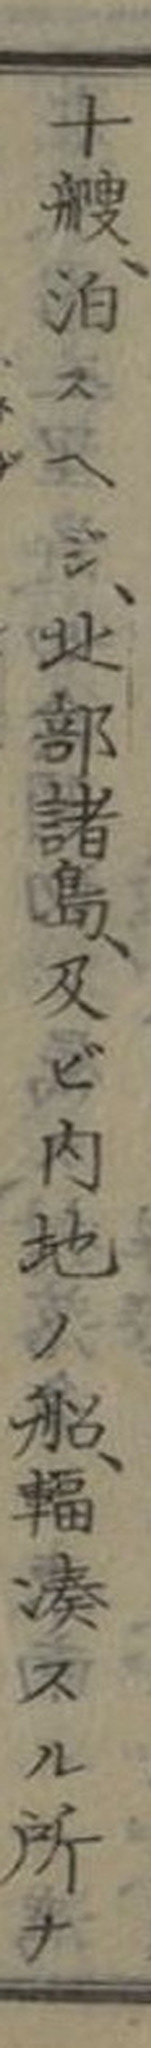十艘、泊スヘジ、北部諸島、及ビ内地ノ船、輻湊スル所ナ

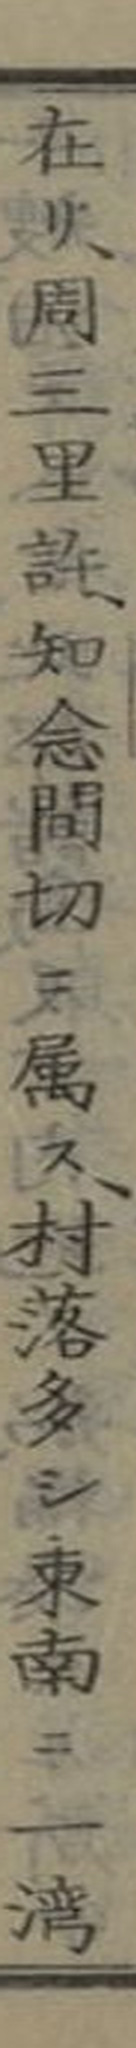在リ、周三里許、知念間切ニ属ス、村落多シ東南ニ一湾
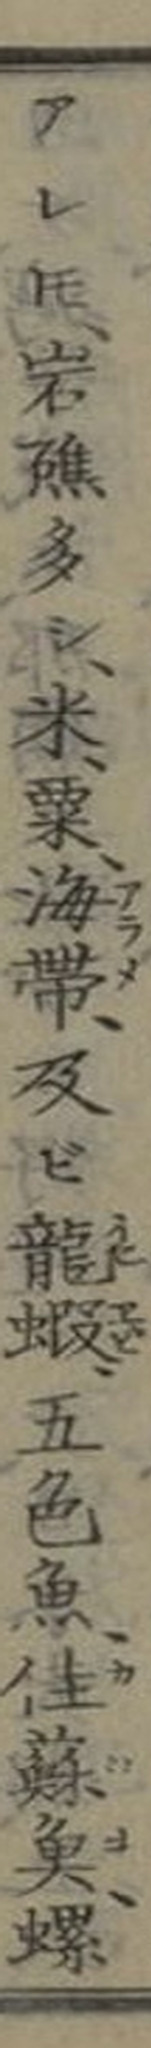アレトモ、岩礁多シ、米、粟、海帯、及ビ竜蝦、五色魚、佳蘇魚、螺
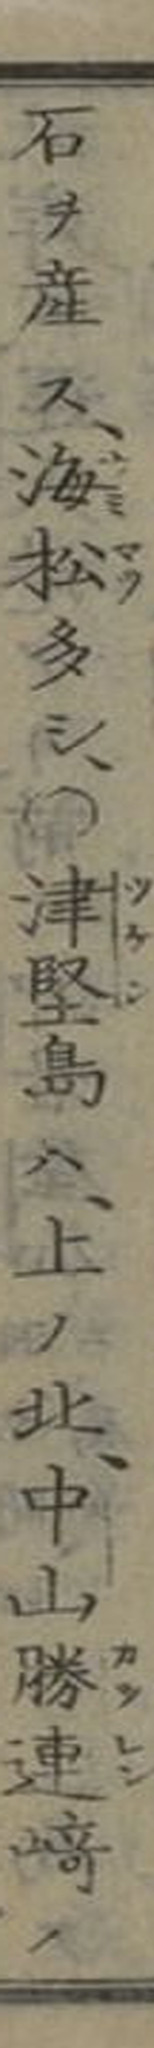石ヲ産ス、海松多シ、○津堅島ハ、上ノ北、中山勝連崎ノ
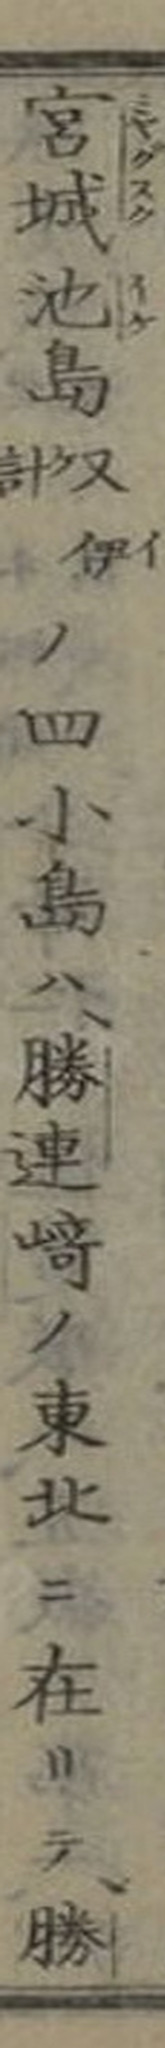宮城池島又伊計ノ四小島ハ、勝連崎ノ東北ニ在リテ、勝
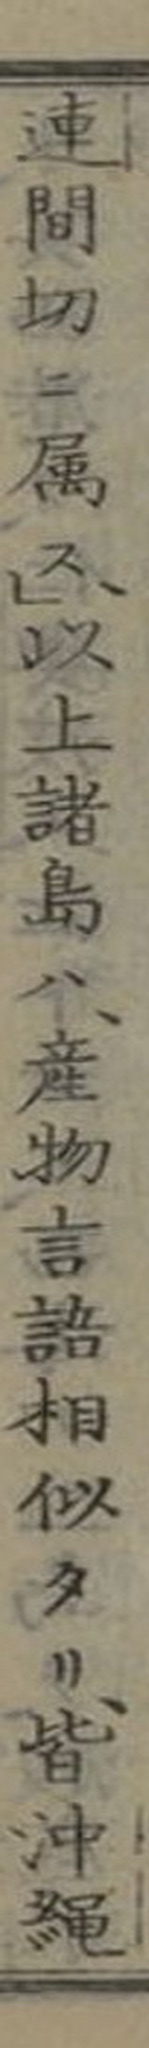連間切ニ属ス、」以上諸島ハ、産物言語相似タリ、皆沖縄
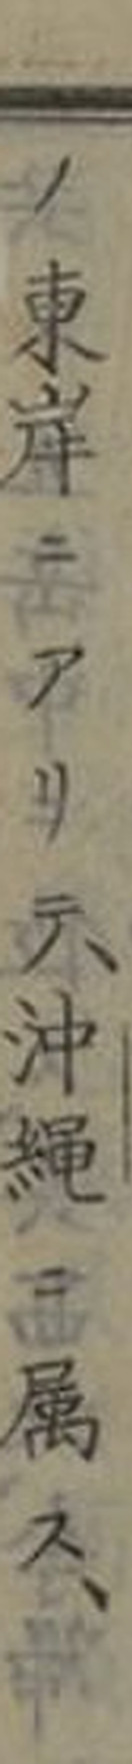ノ東岸ニアリテ、沖縄ニ属ス、
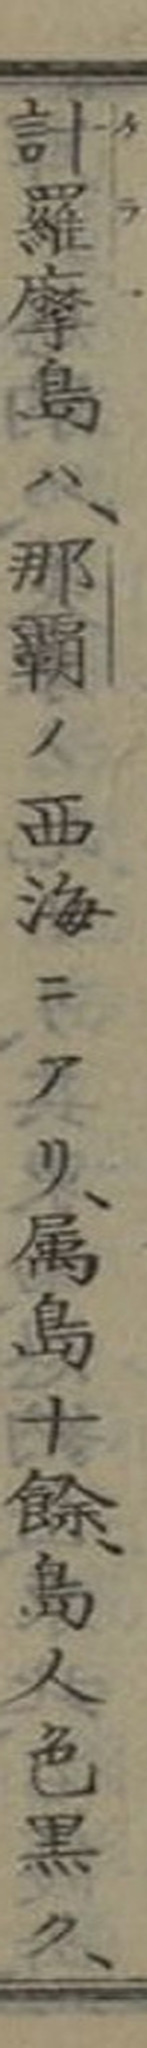計羅摩島ハ、那覇ノ西海ニアリ、属島十余、島人色黒ク、
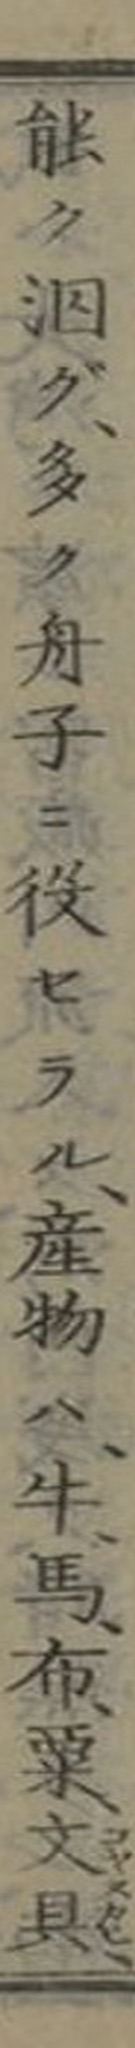能ク泅グ、多ク舟子ニ役セラル、産物ハ、牛、馬、布、粟、文貝、
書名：琉球新誌 図附 上
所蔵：University of the Ryukyus Library
